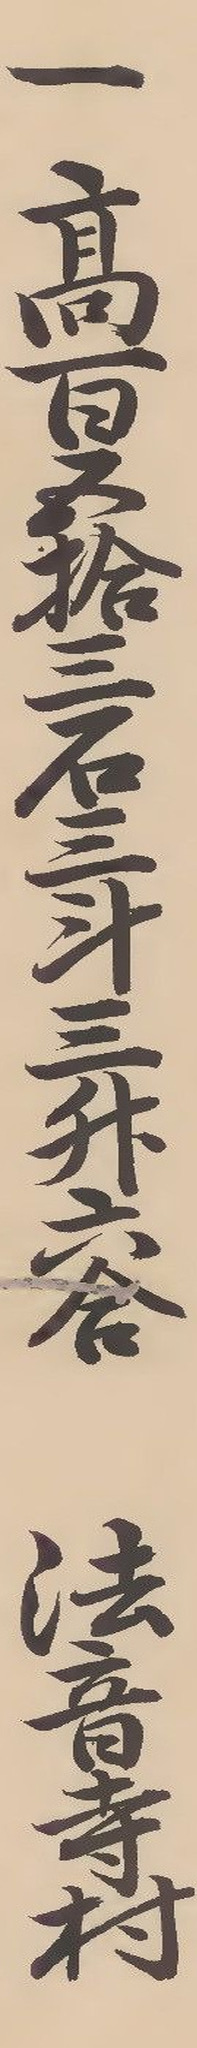一高百五拾三石三斗三升六合法音寺村

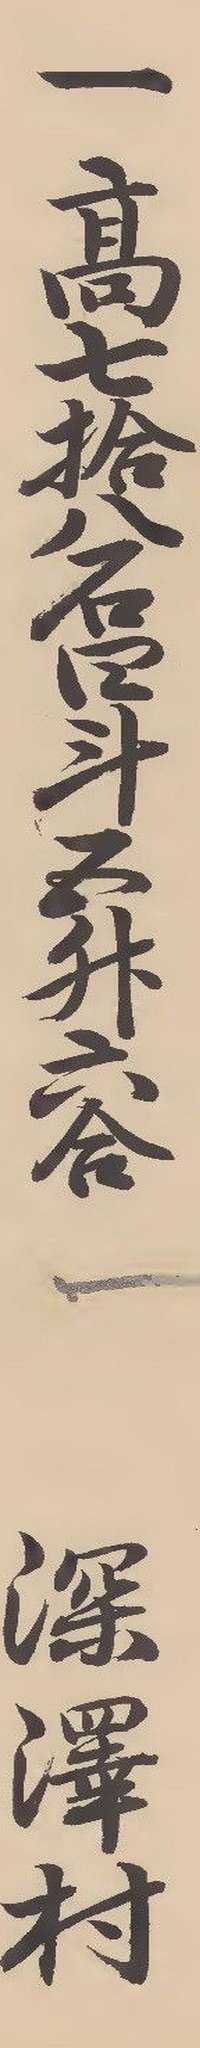一高七拾八石四斗五升六合深沢村
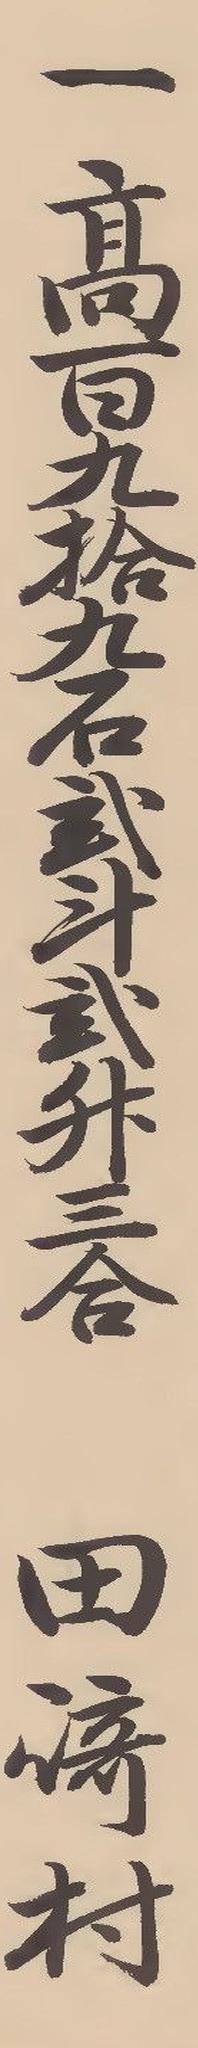一高百九拾九石弐斗弐升三合田崎村
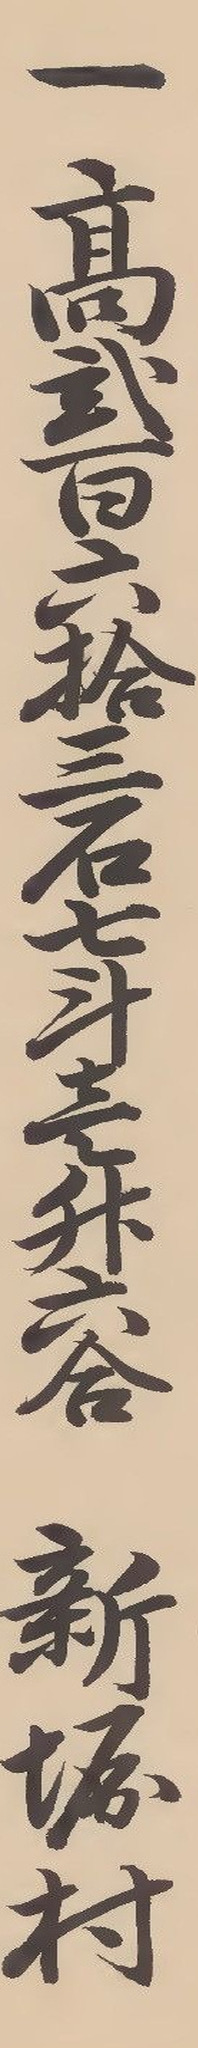一高弐百六拾三石七斗壱升六合新堀村
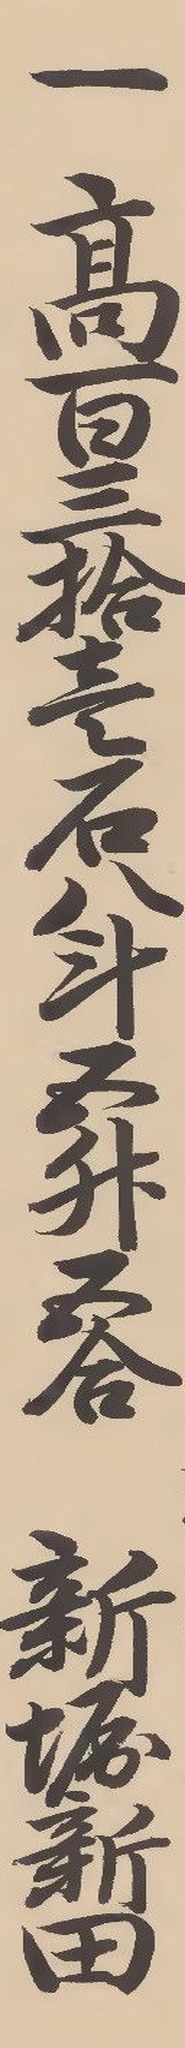一高百三拾壱石八斗五升五合新堀新田
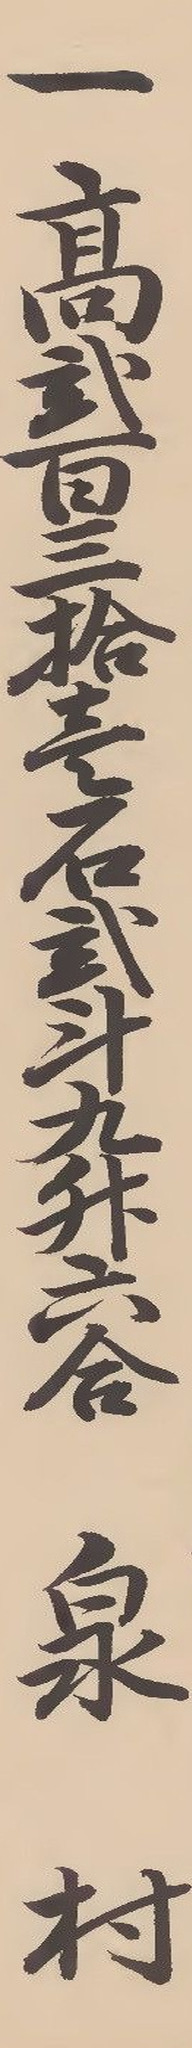一高弐百三拾壱石弐斗九升六合泉村
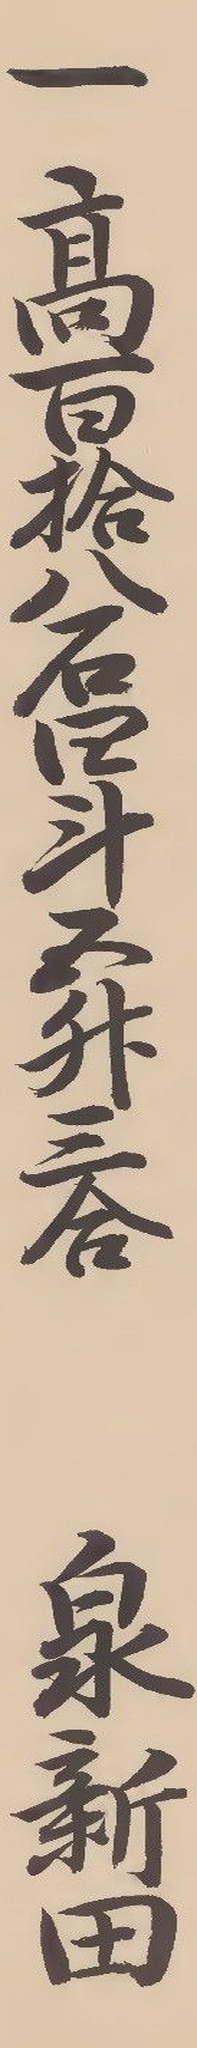一高百拾八石四斗五升三合泉新田
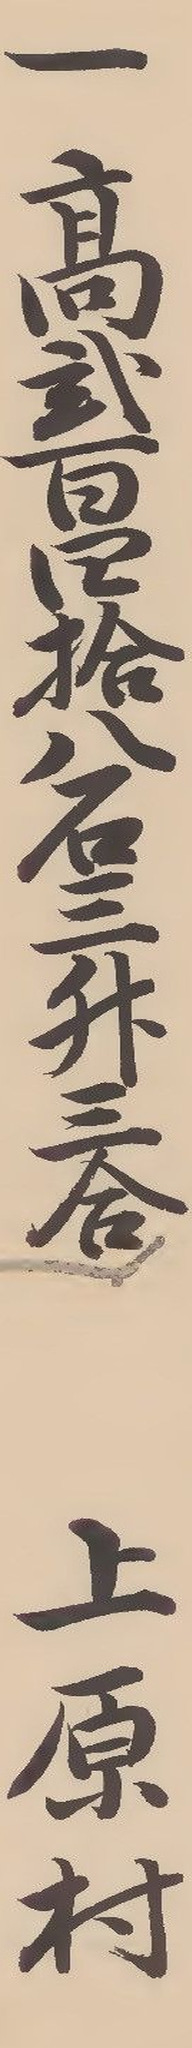一高弐百四拾八石三升三合上原村

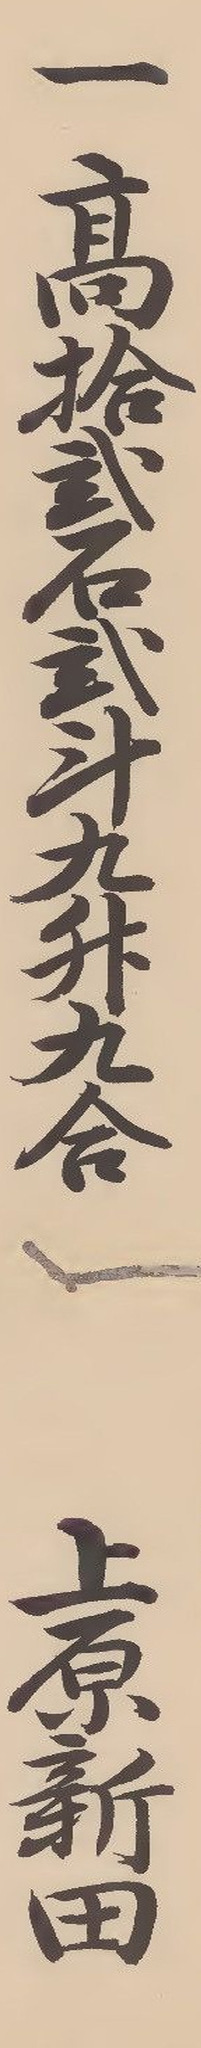一高拾弐石弐斗九升九合上原新田
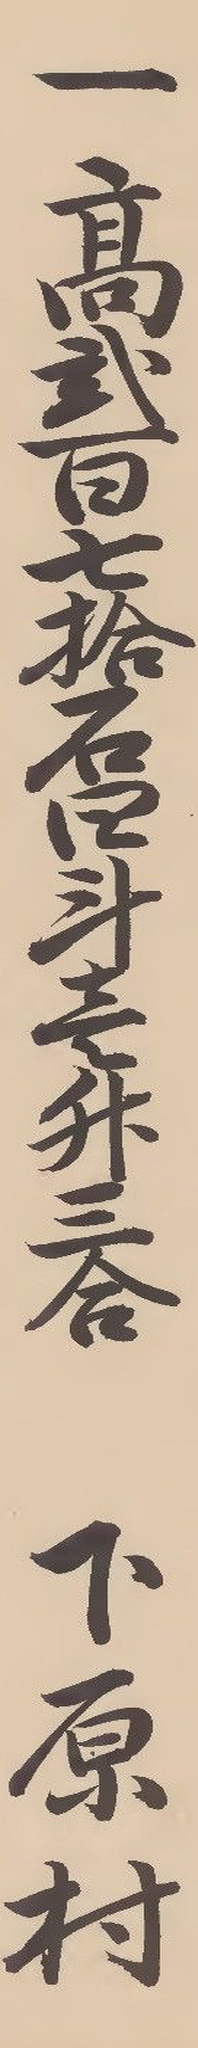一高弐百七拾石四斗壱升三合下原村
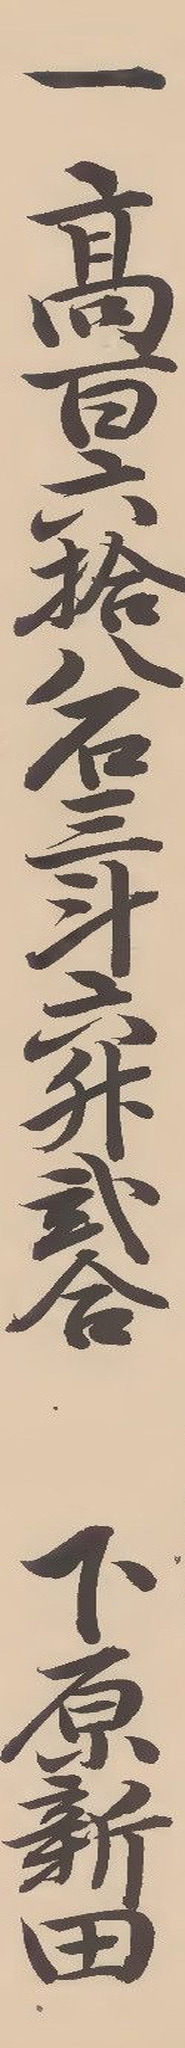一高百六拾八石三斗六升弐合下原新田
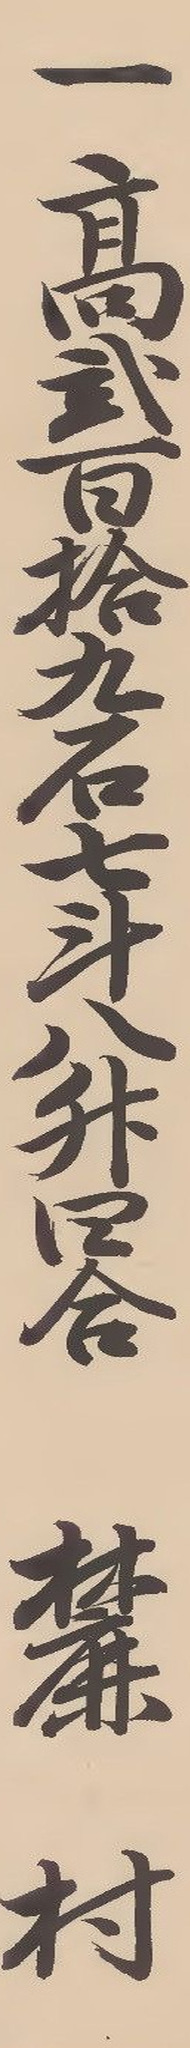一高弐百拾九石七斗八升四合麓村
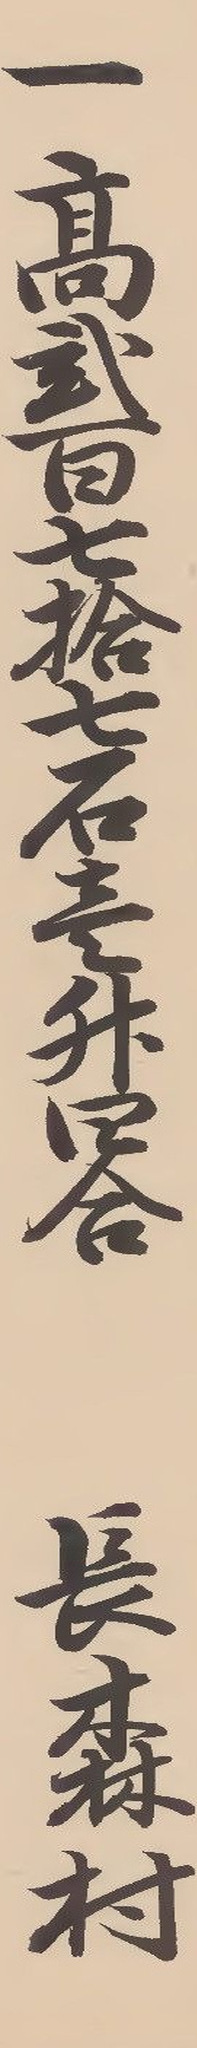一高弐百七拾七石壱升四合長森村
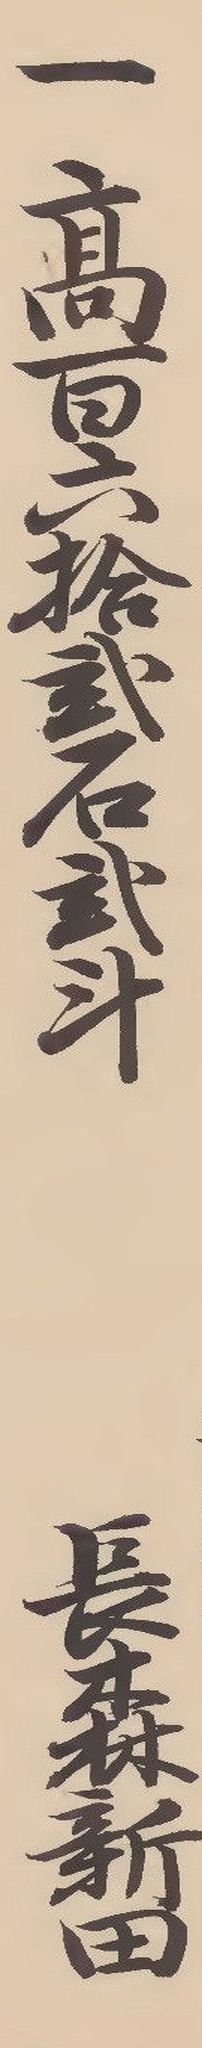一高百六拾弐石弐斗長森新田

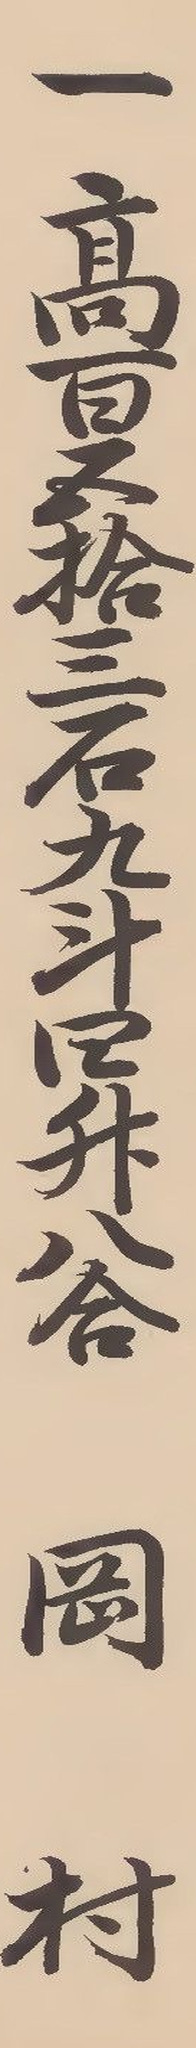一高百五拾三石九斗四升八合岡村
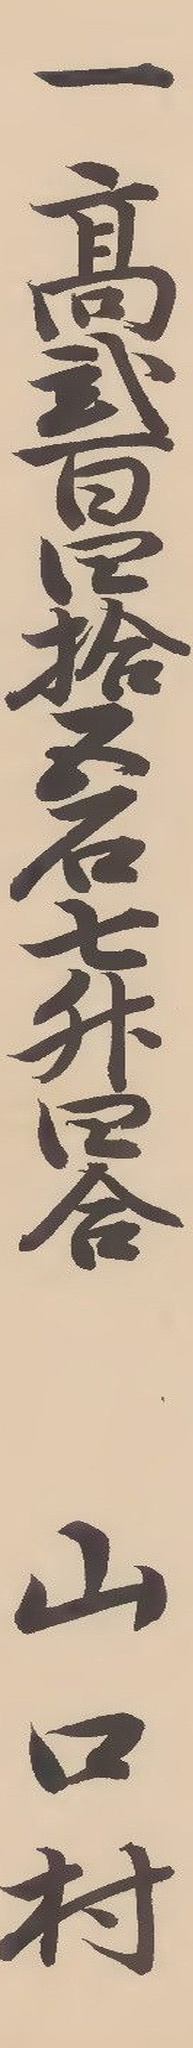一高弐百四拾五石七升四合山口村
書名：越後国郷帳　中
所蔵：国立公文書館 National Archives of Japan
